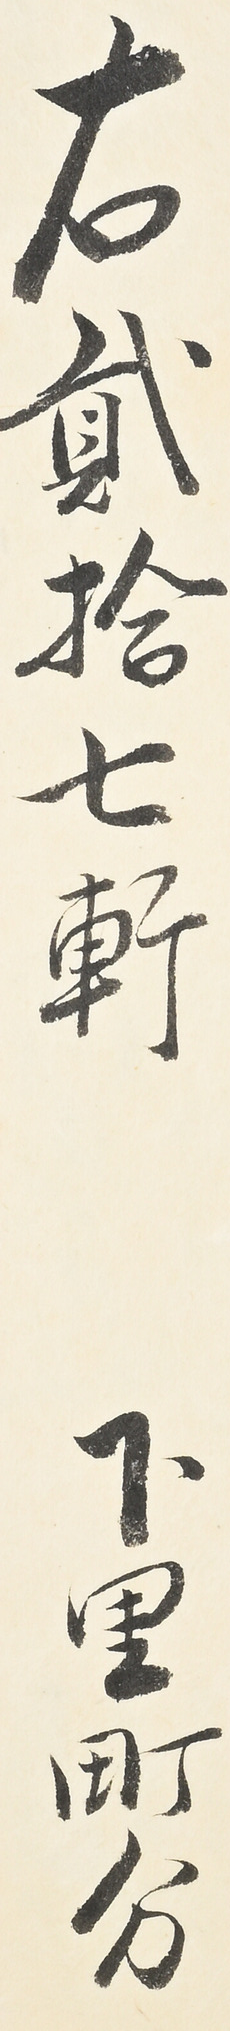右弐拾七軒下里町分
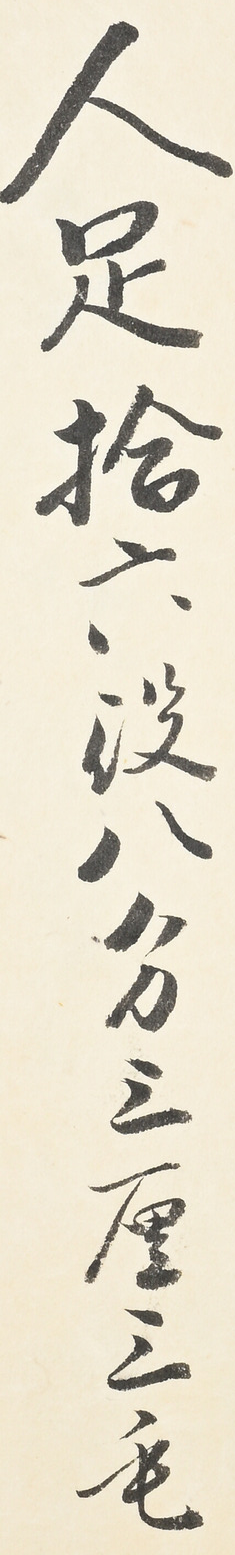人足拾六役八分三厘三毛

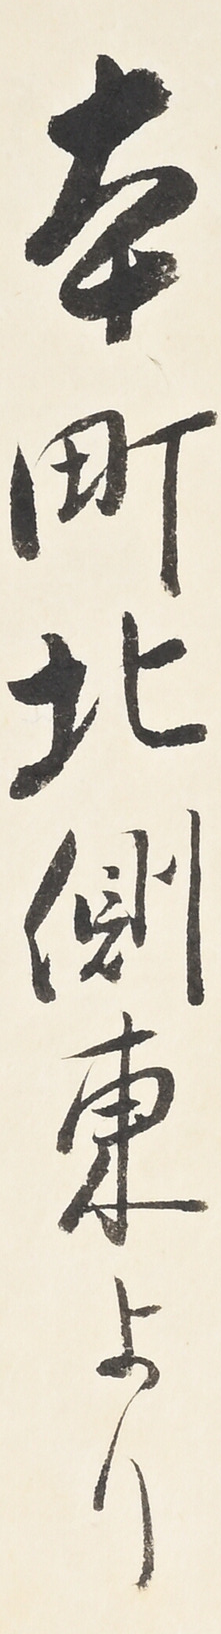本町北側東より
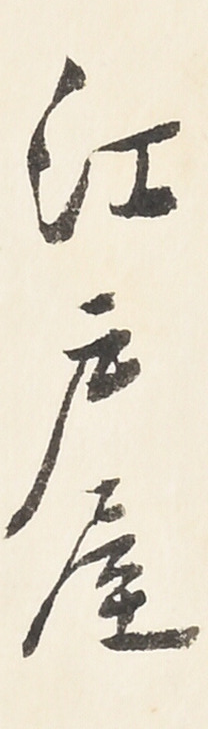江戸屋
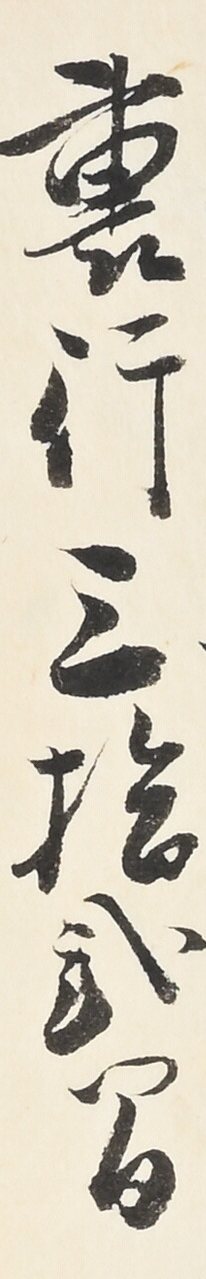裏行三拾弐間
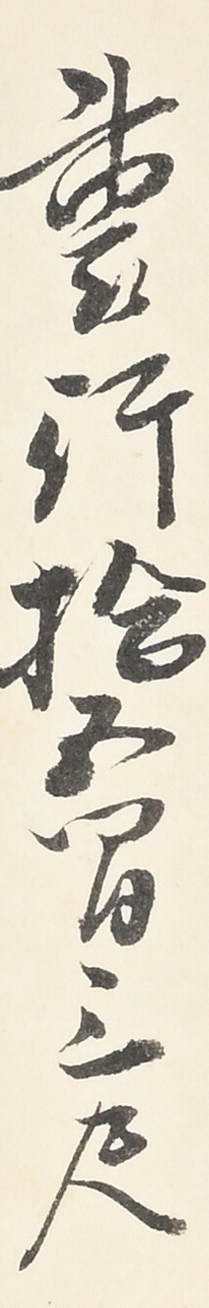裏行拾四間壱尺
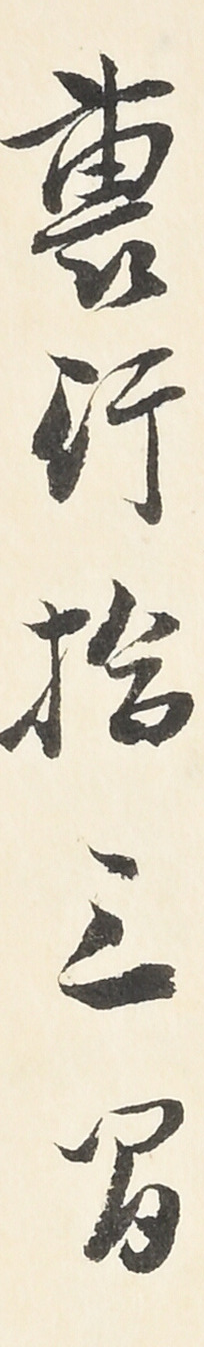裏行拾三間
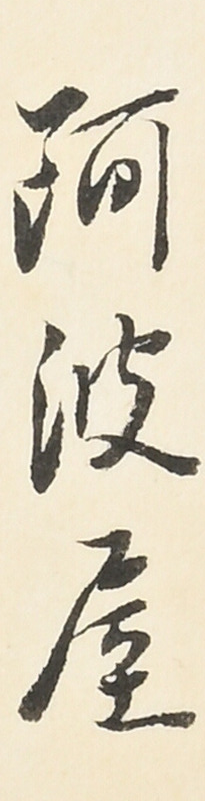阿波屋
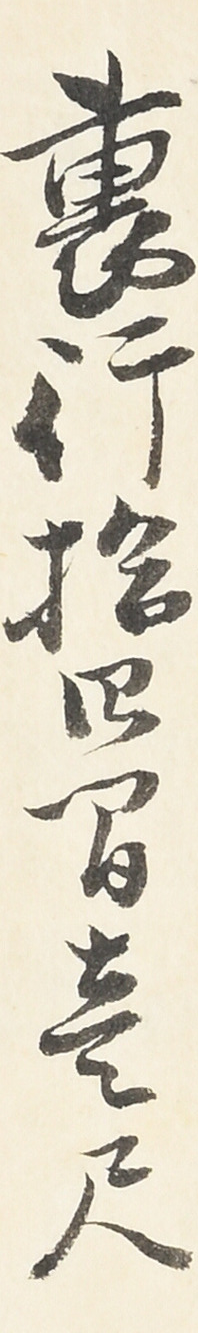裏行拾四間壱尺
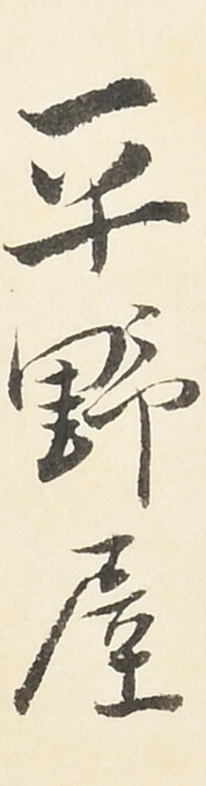平野屋
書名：高遠町家数并間数改帳
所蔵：伊那市立高遠町図書館・合同会社AMANE
